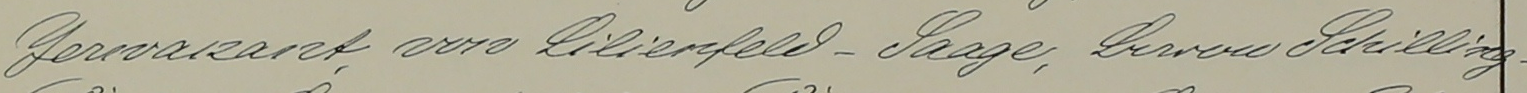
Jerwakant, von Lilienfeld-Saage, Baron Schilling-
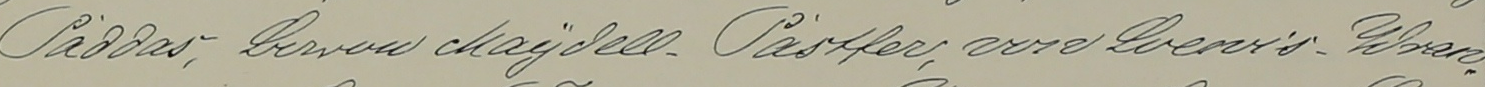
Paddas, Baron Maydell-Pastfer, von Loewis-Wran-
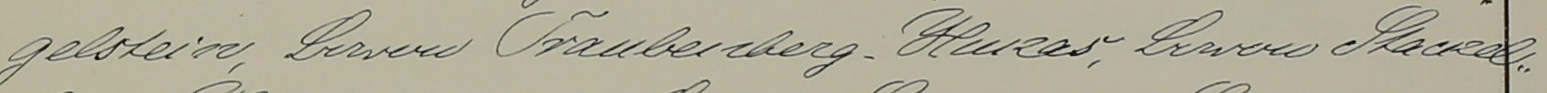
gelstein, Baron Traubenberg-Hukas, Baron Stackel-
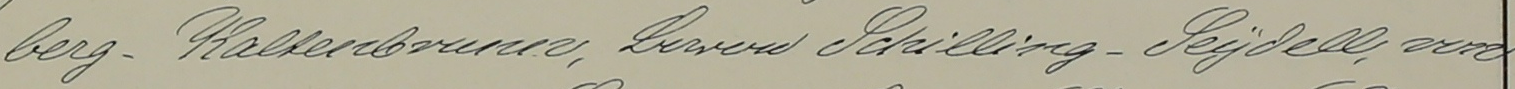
berg-Kaltenbrunn, Baron Schilling-Seydell, von
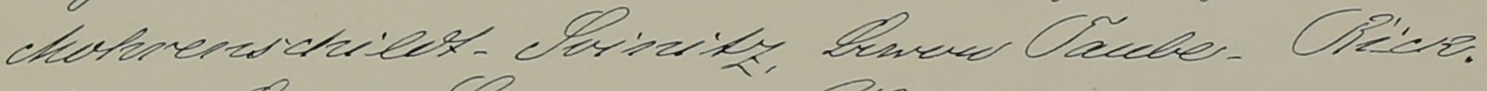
Mohrenschildt-Soinitz, Baron Taube-Rick-
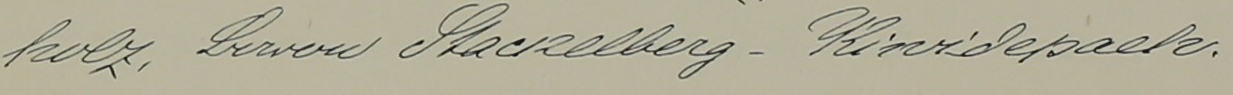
holz, Baron Stackelberg-Kiwidepaeh.
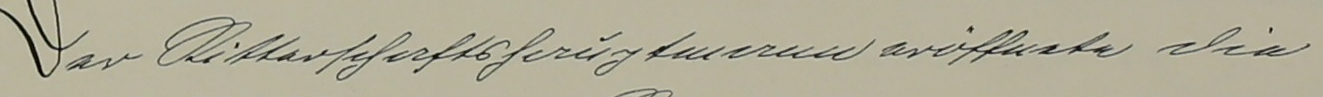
Der Ritterschaftshauptmann eröffnete die
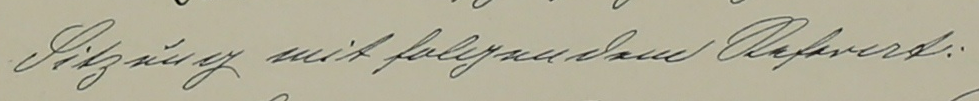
Sitzung mit folgendem Referat:
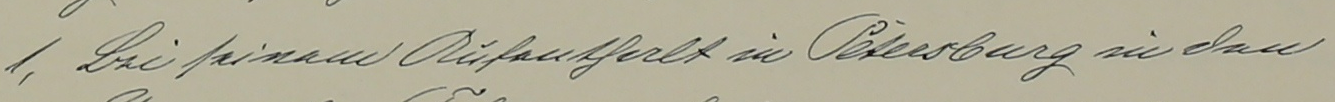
1. Bei seinem Aufenthalt in Petersburg in den
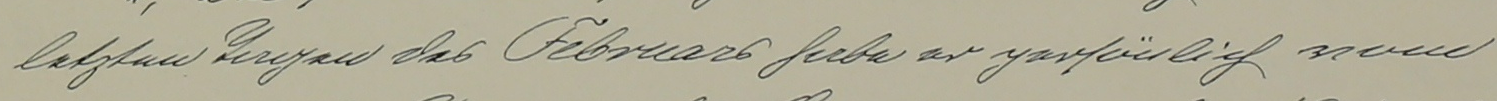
letzten Tagen des Februars habe er persönlich vom
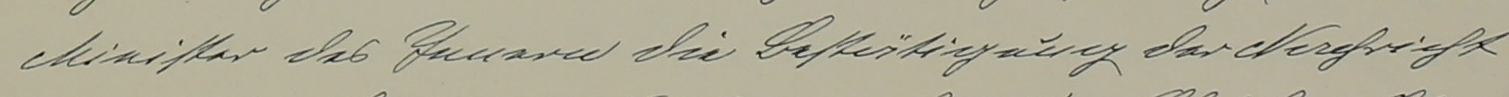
Minister des Innern die Bestätigung der Nachricht
